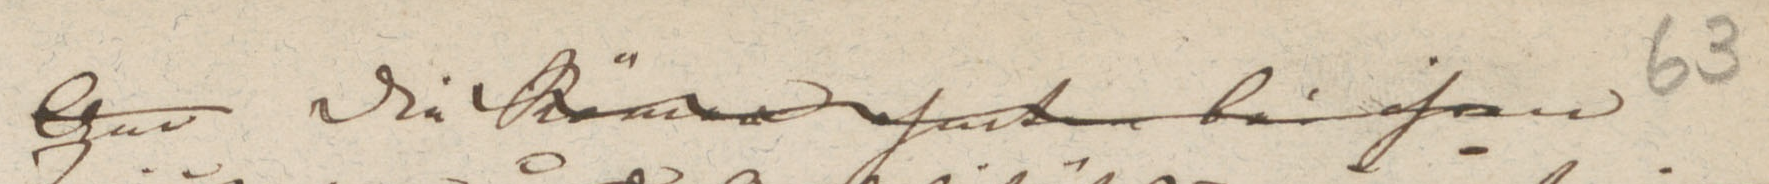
Am Die Römer ahmten bei ihren
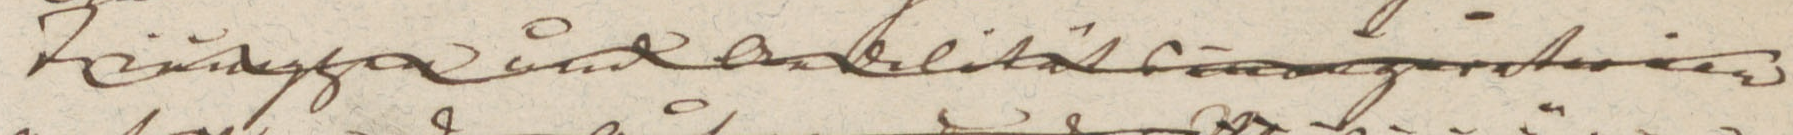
Triumphen und Aedilitätsperatorien
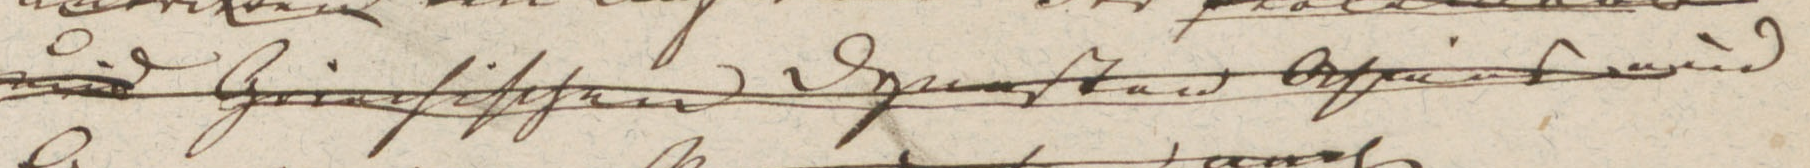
und Griechischen Dynasten Asiens und
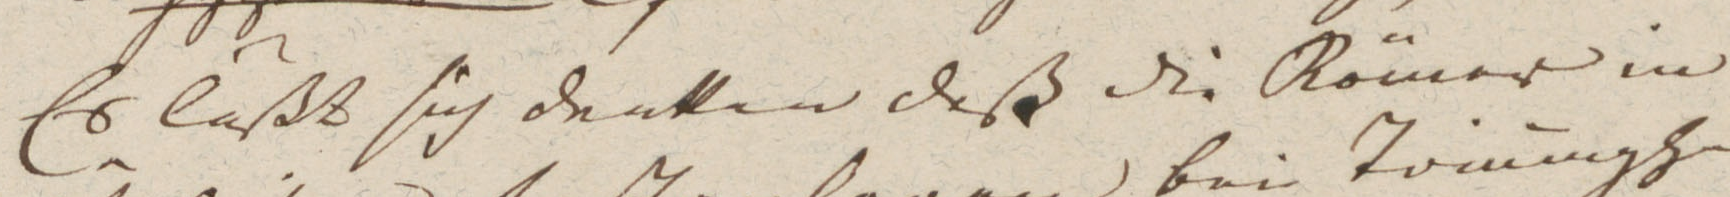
Es lässt sich denken dass die Römer in
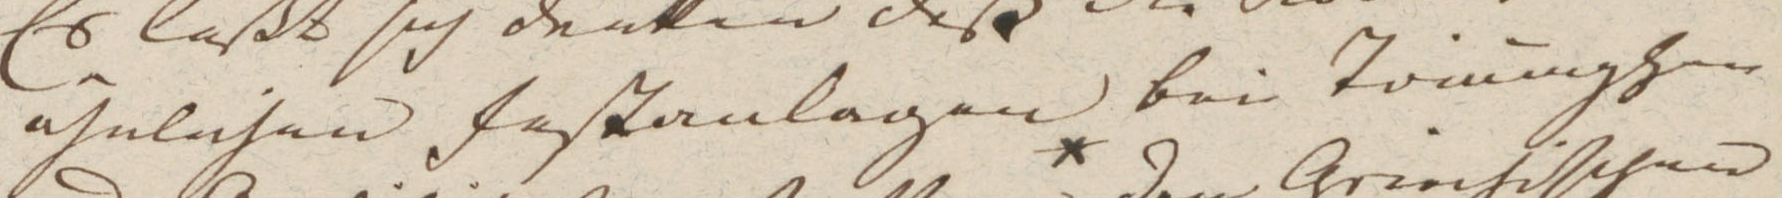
ähnlichen Festanlagen bei Triumphen
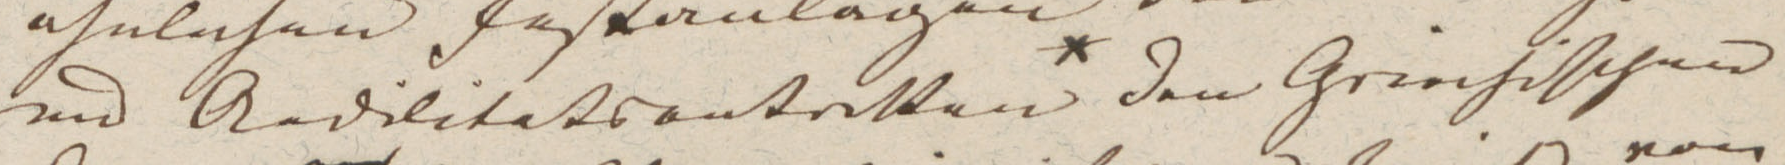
und Aedilitatsantritten % den Griechischen
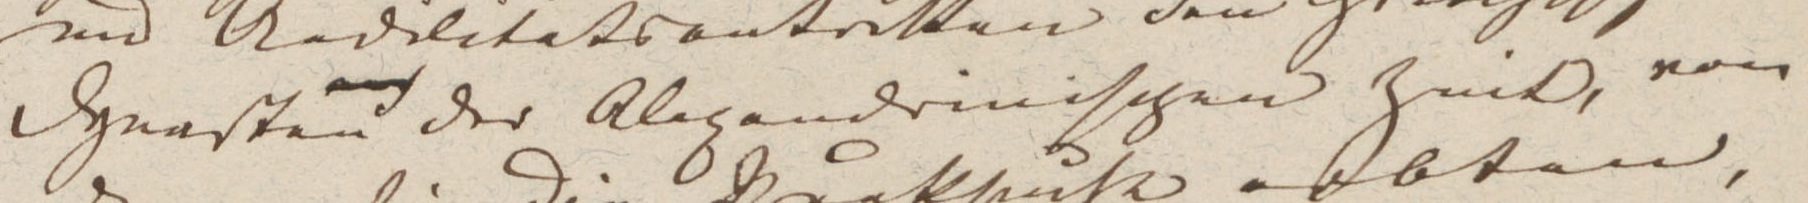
Dynasten nach der Alexandrinischen Zeit, von
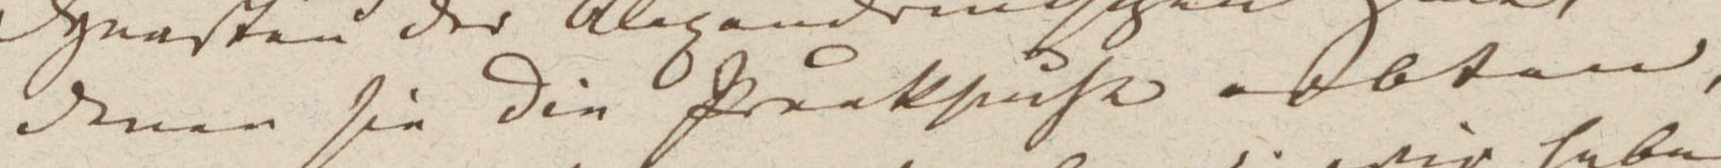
denen sie die Prunksucht erbten,
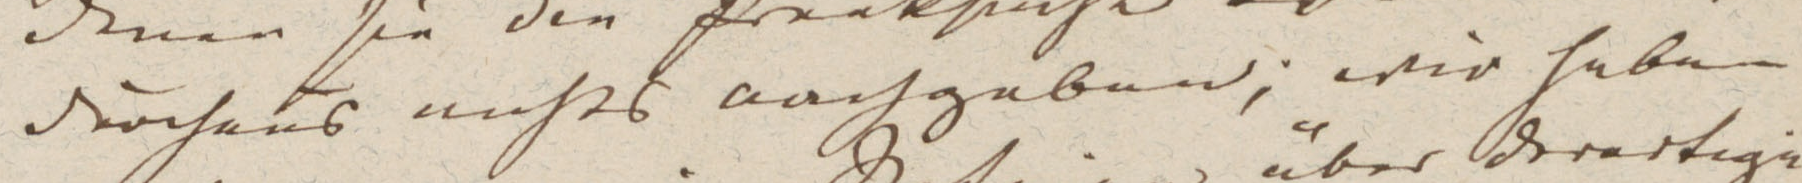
durchaus nichts nachgaben; wir haben
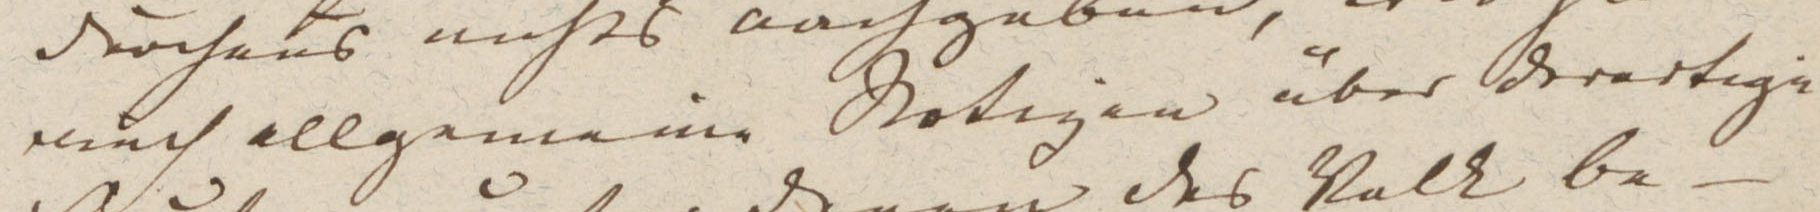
auch allgemeine Notizen über derartige
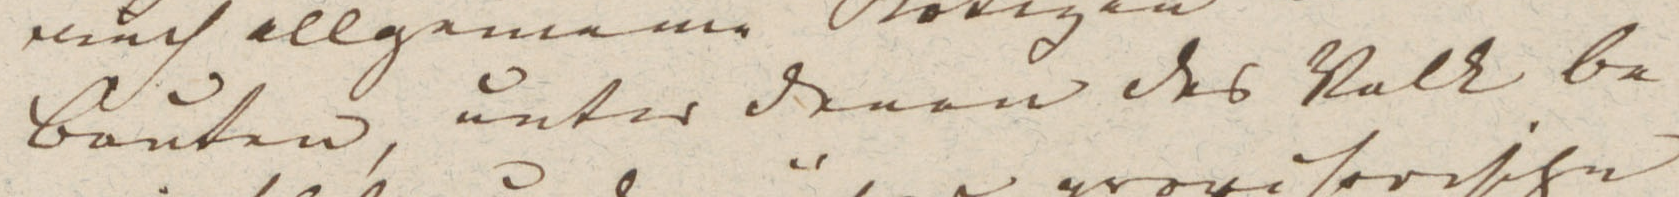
Bauten, unter denen das Volk be-
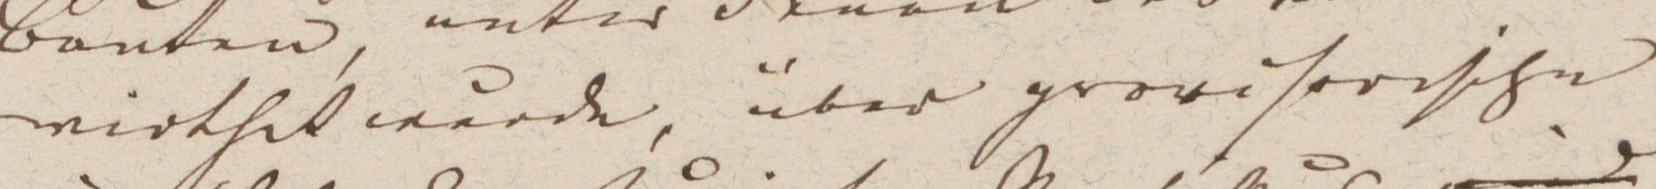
wirthet wurde, über provisorische
